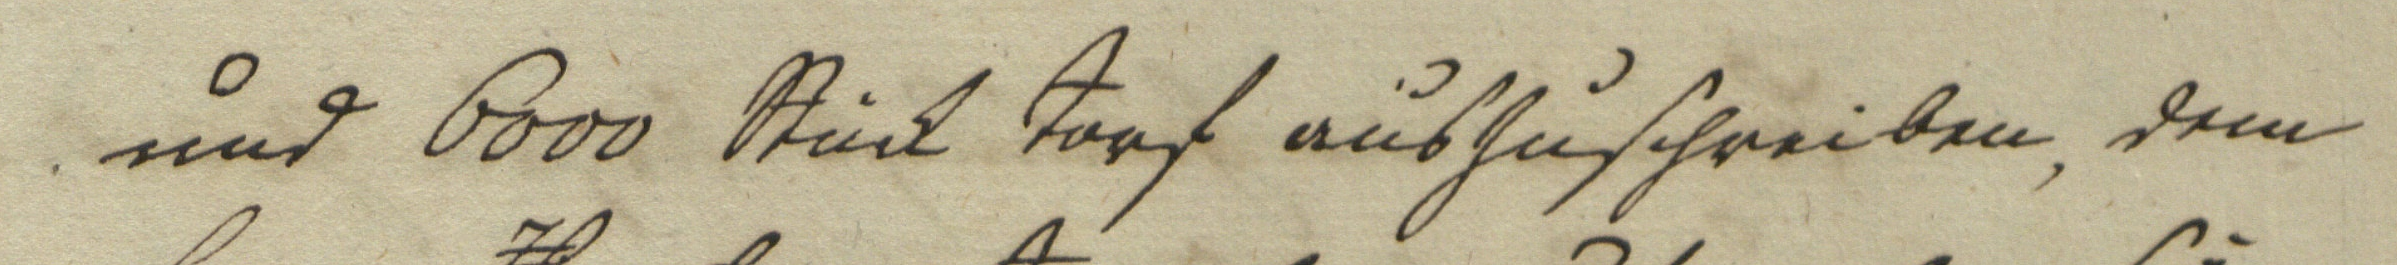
und 6000 Stück Torf auszuschreiben, dem
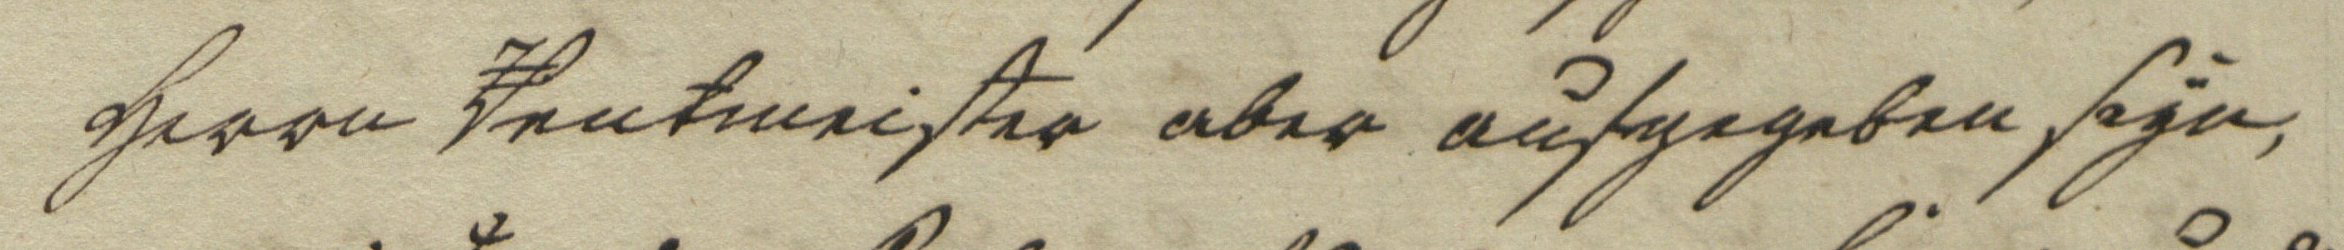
Herrn Rentmeister aber aufgegeben seÿn,
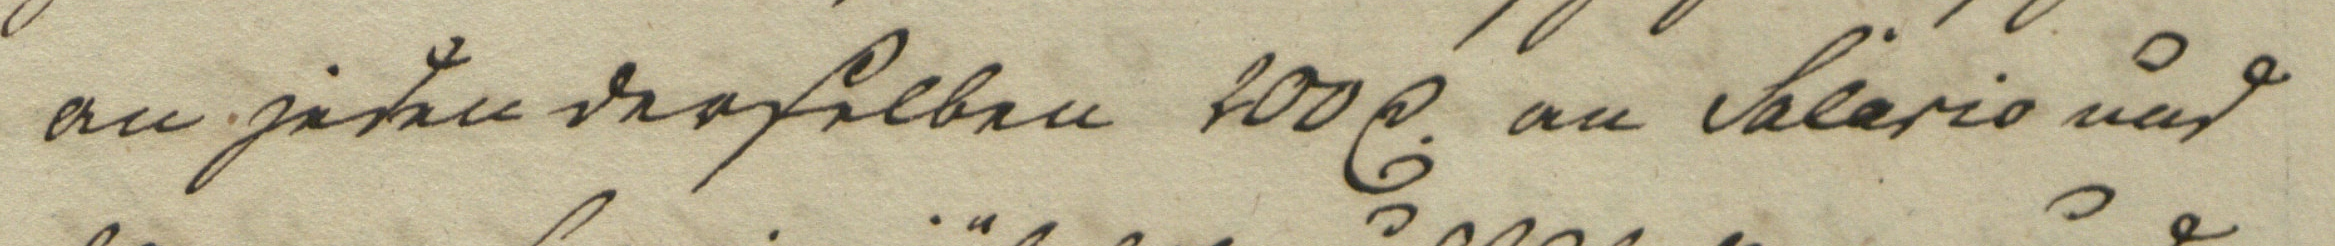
an jeden derselben 200 l. an Salario und
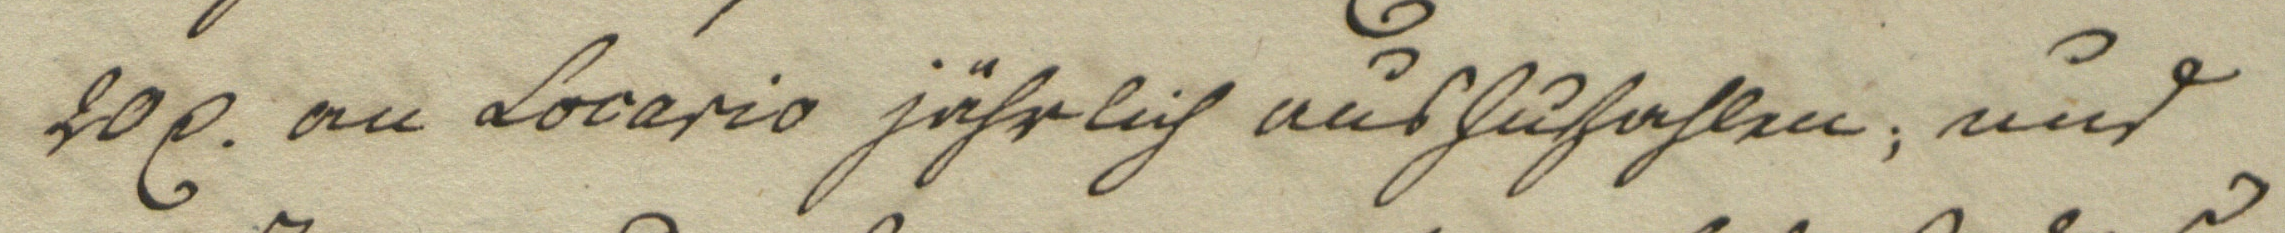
20 l. an Locario jährlich auszuzahlen; und
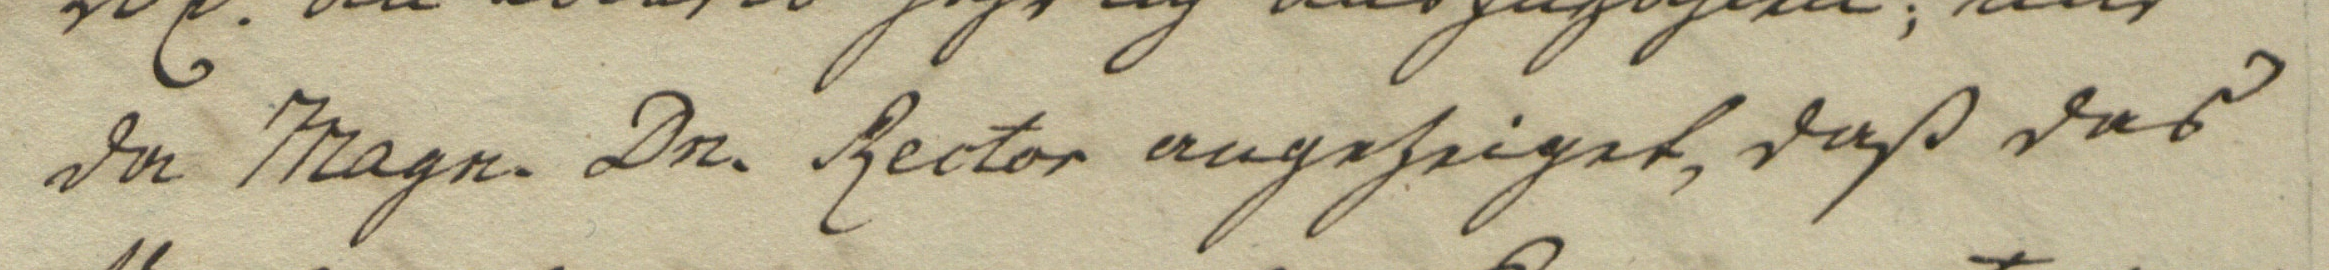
da Magn. Dn. Rector angezeiget, daß das
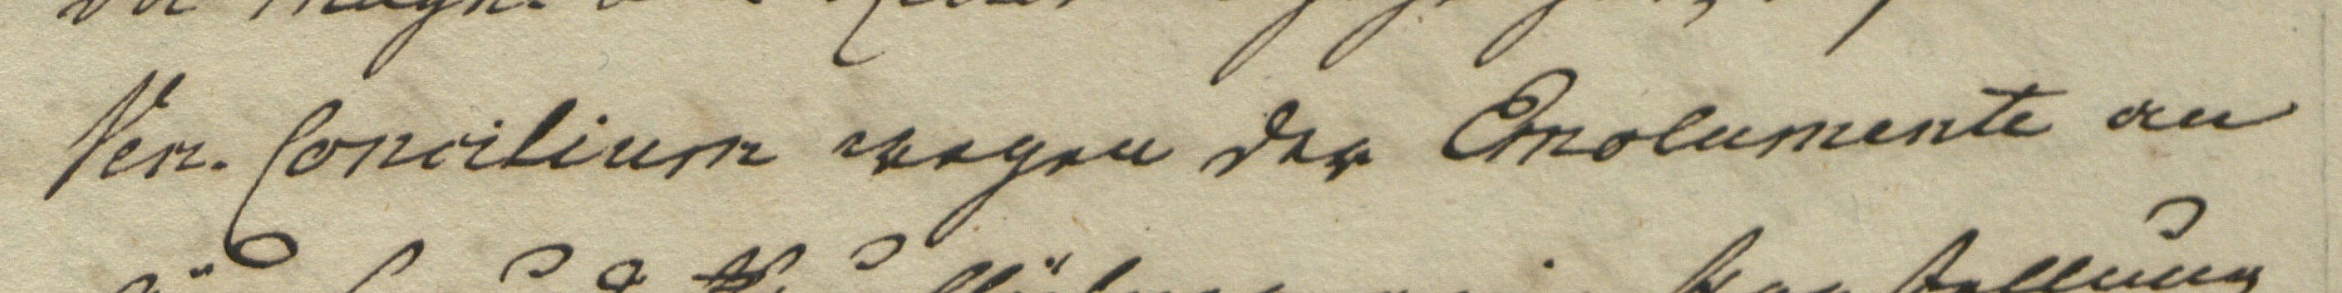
Ven. Concilium wegen der Emolumente an
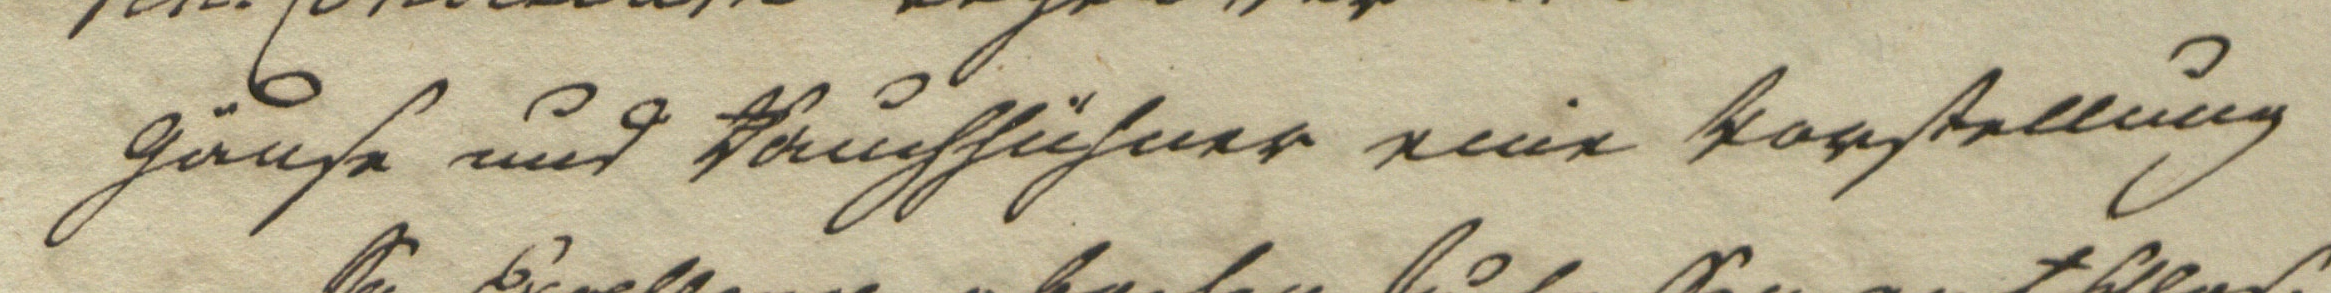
Gänse und Rauchhühner eine Vorstellung
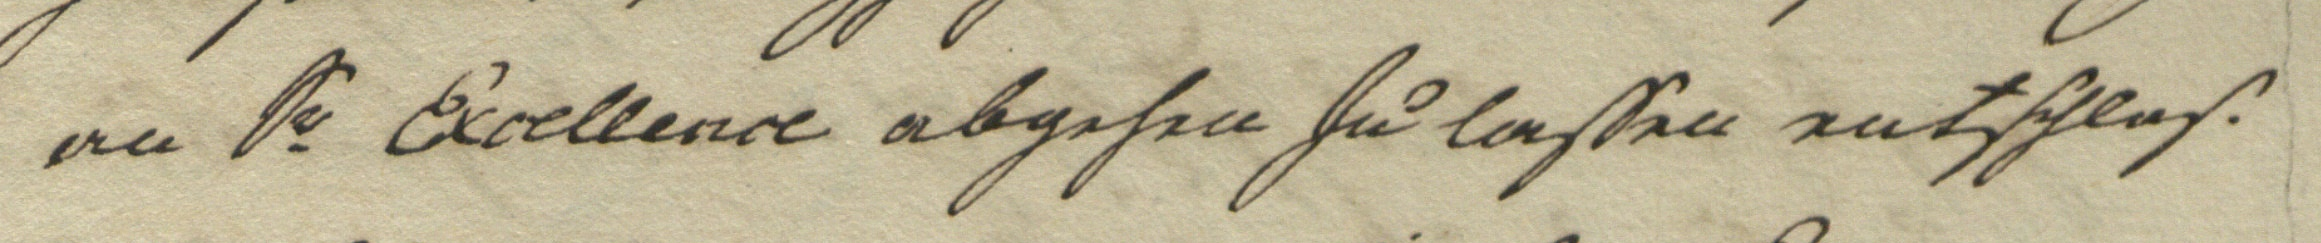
an Sr Excellence abgehen zu lassen entschlos¬
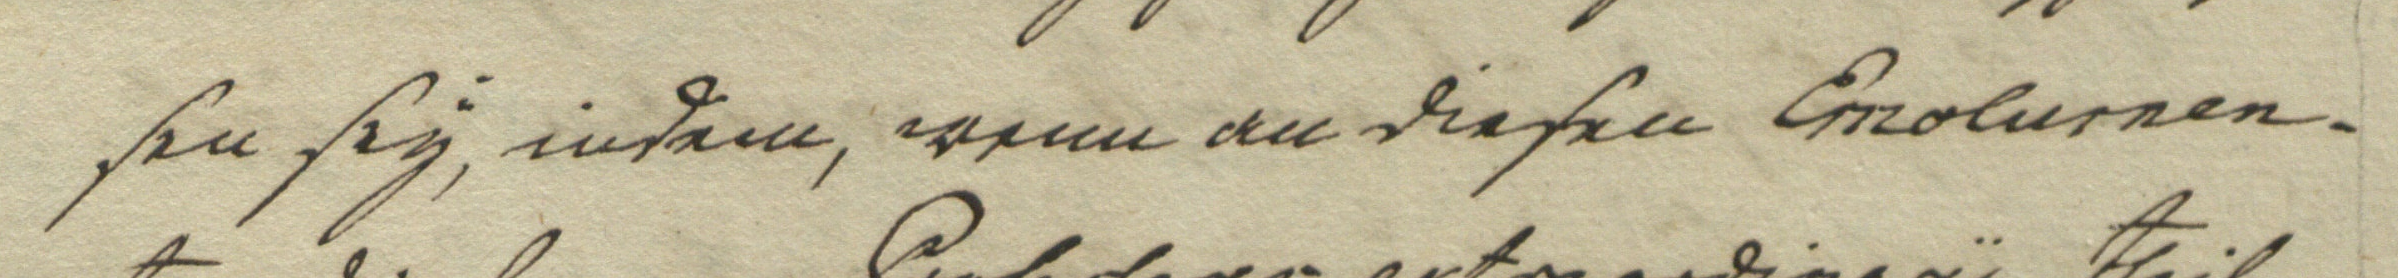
sen seÿ, indem, wenn an diesem Emolumen¬
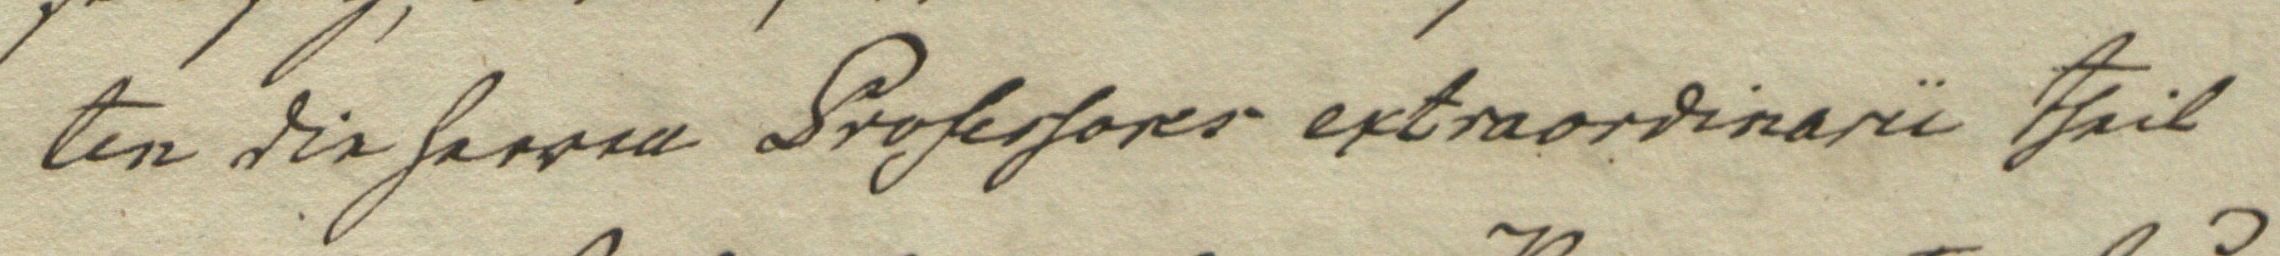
ten die Herren Professores extraordinarii Theil
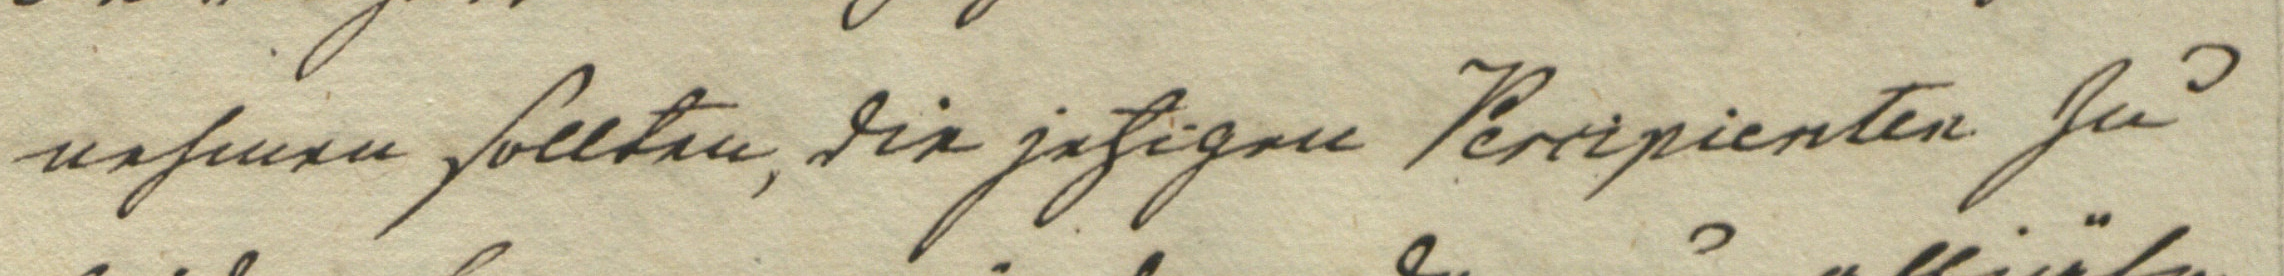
nehmen sollten, die jetzigen Percipienten zu
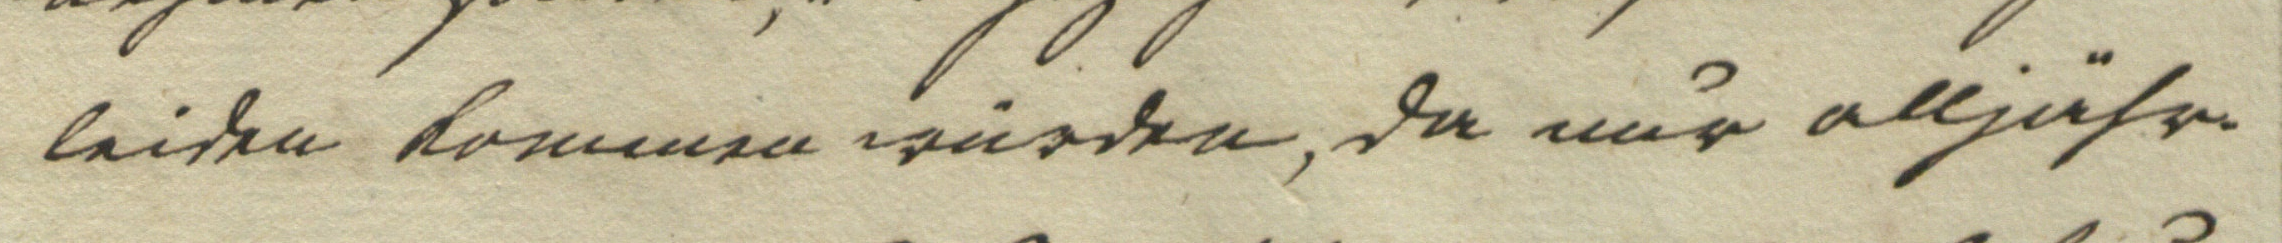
leiden kommen würden, da nur alljähr¬
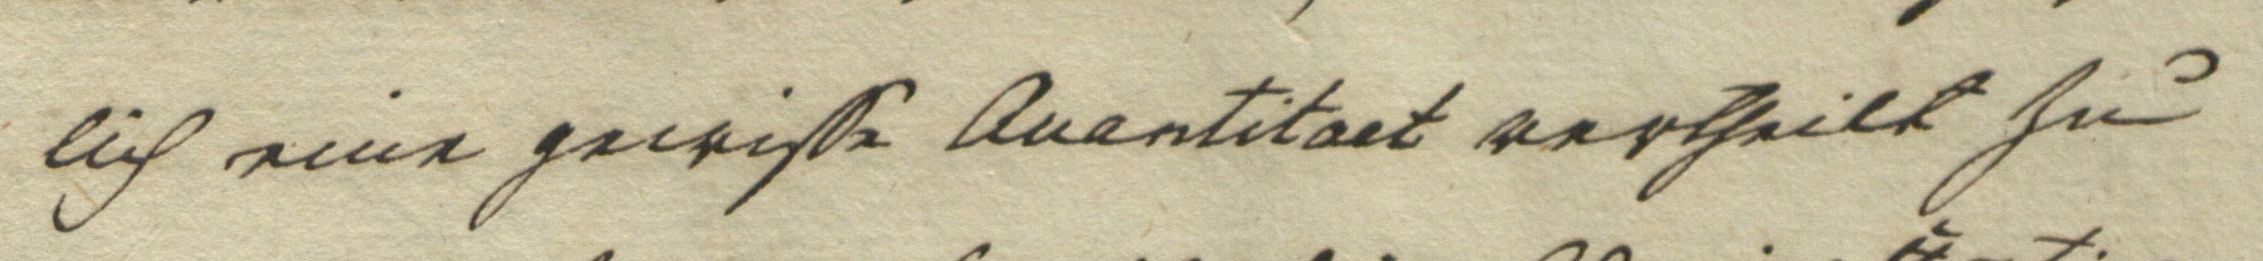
lich eine gewisse Quantitaet vertheilt zu
